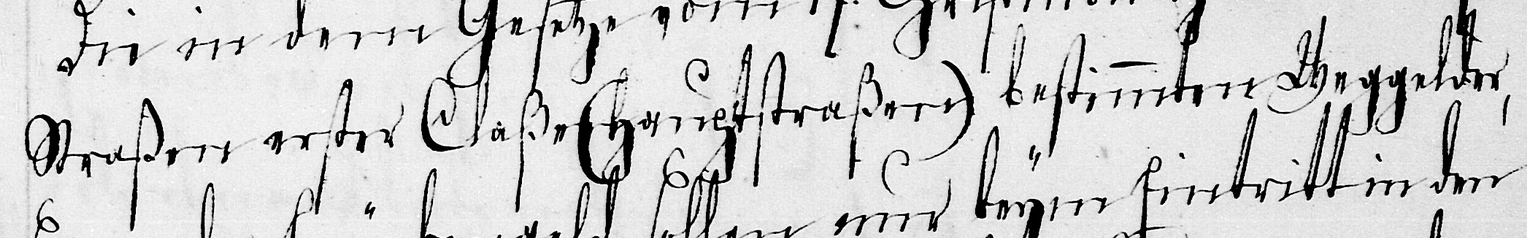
Straßen erster Claße (Hauptstraßen) bestimmten Weggelder,
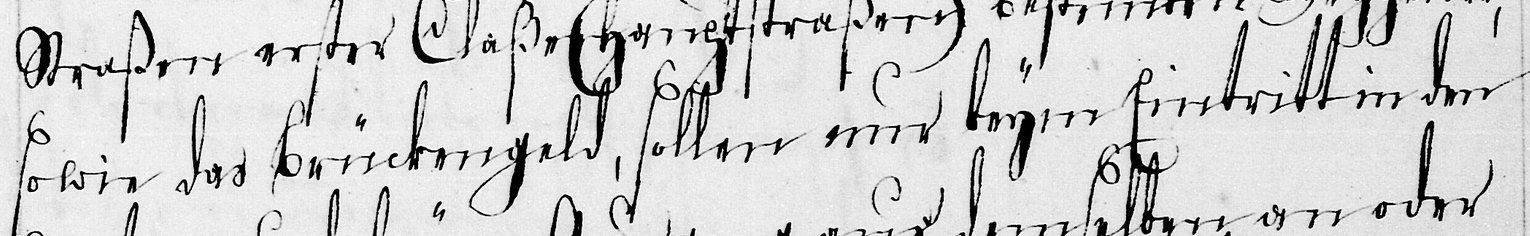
sowie das Brückengeld, sollen nur beym Eintritt in den
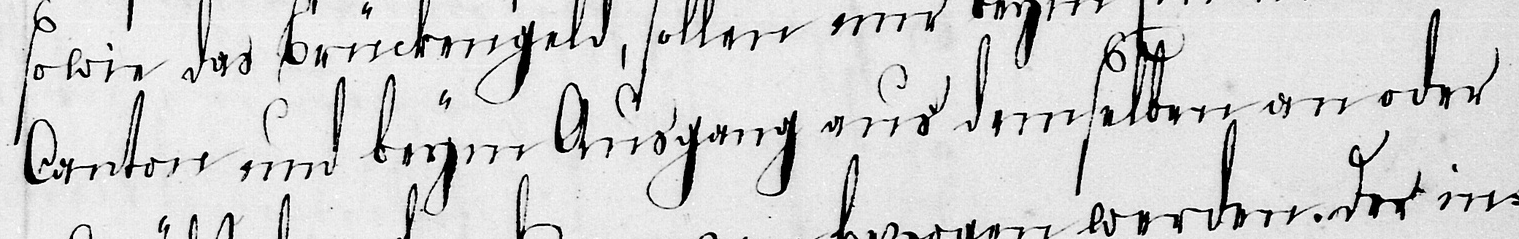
Canton und beym Ausgang aus demselben an oder
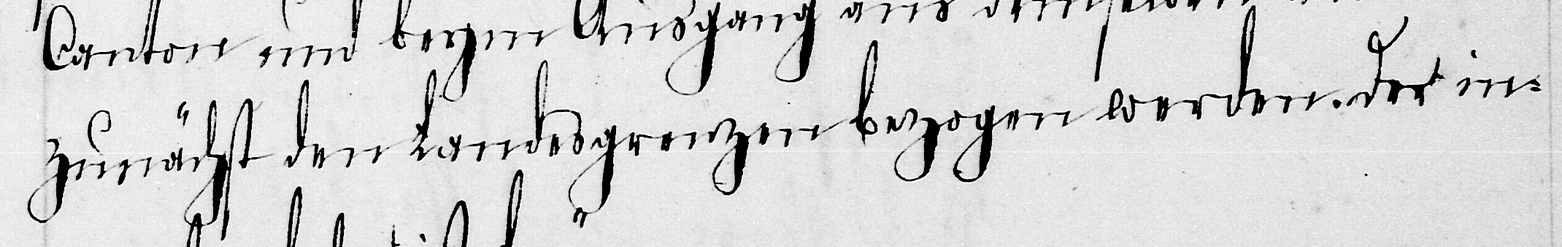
zunächst den Landesgrenzen bezogen werden. Der in¬
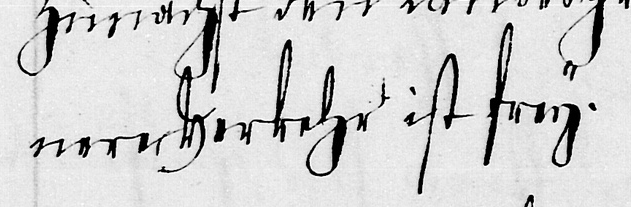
nere Verkehr ist fre¬
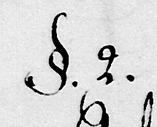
§. 2.
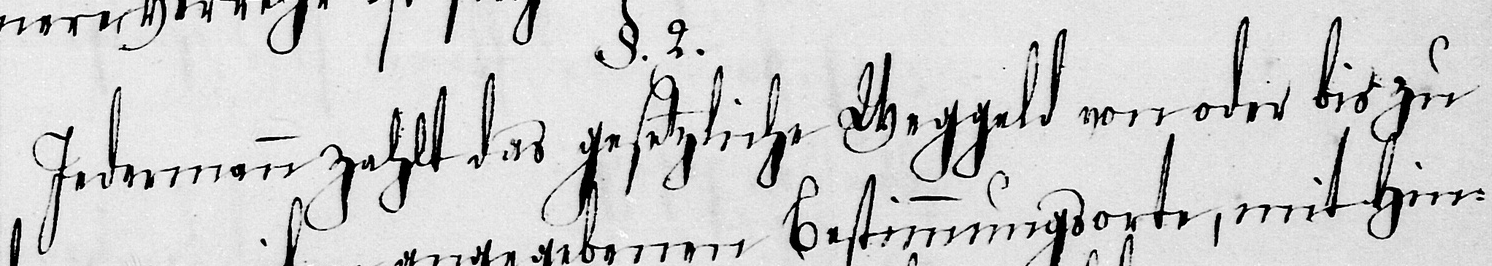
Jedermann zahlt das gesetzliche Weggeld von oder bis zu
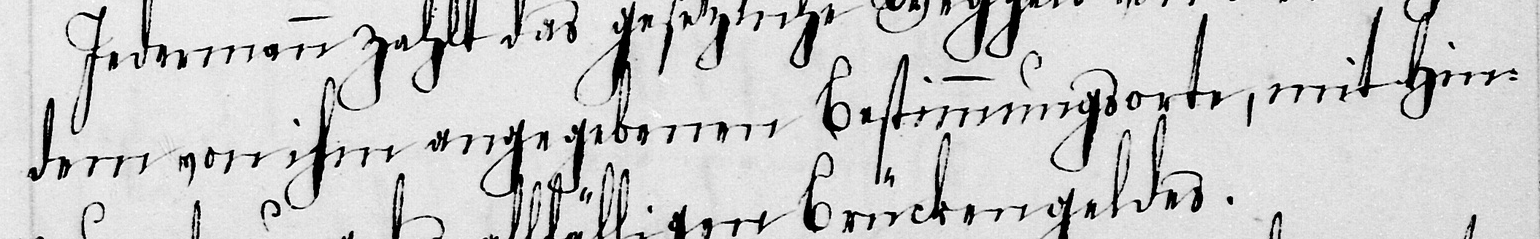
dem von ihm angegebenen Bestimmungsorte, mit Hin¬
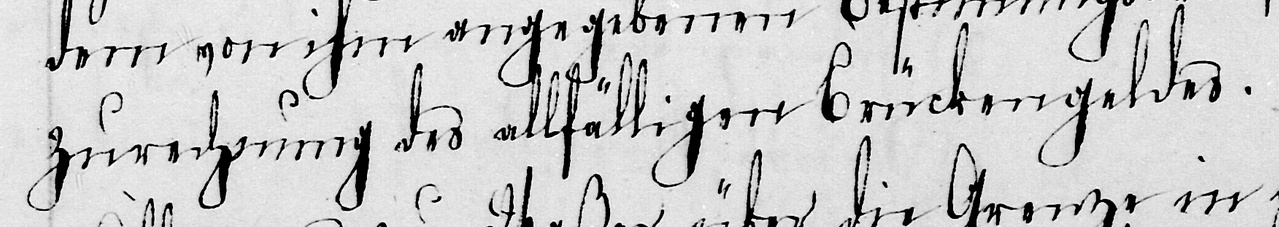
zurechnung des allfälligen Brückengeldes.
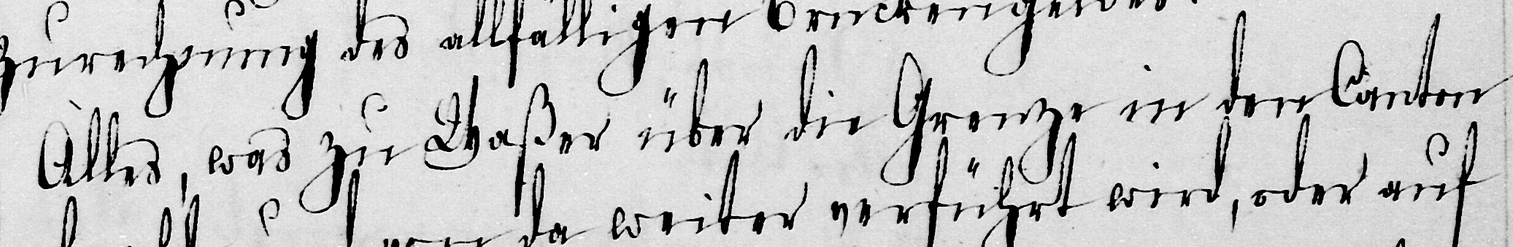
Alles, was zu Waßer über die Grenze in den Canton
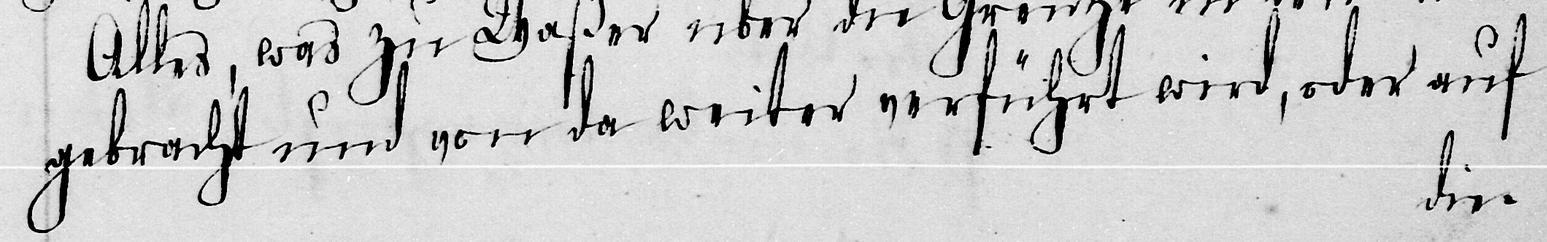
gebracht und von da weiter verführt wird, oder auf
